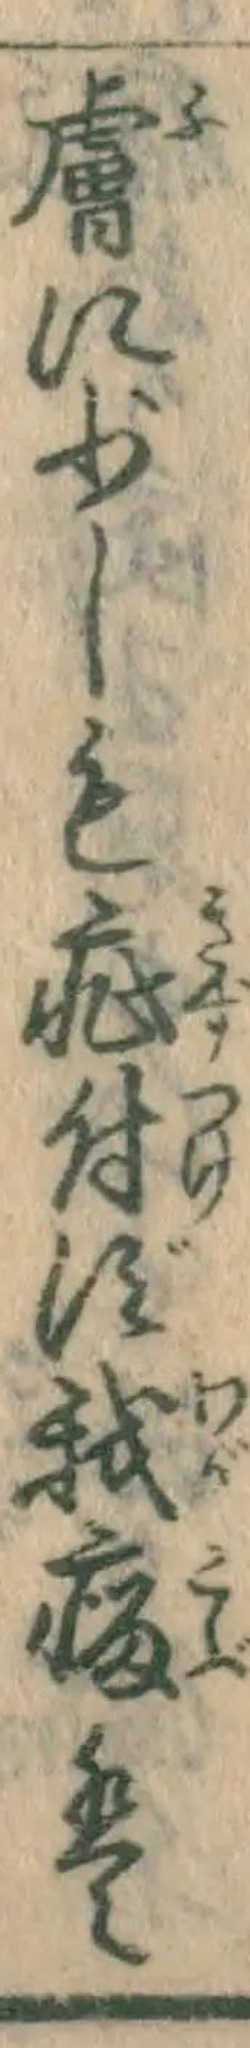膚に少しも疵付ず我瘤は
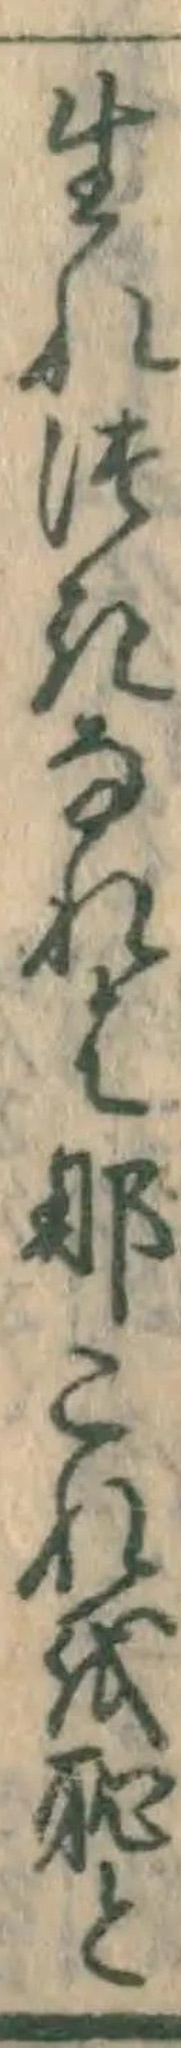生れつきなれは那これを恥と
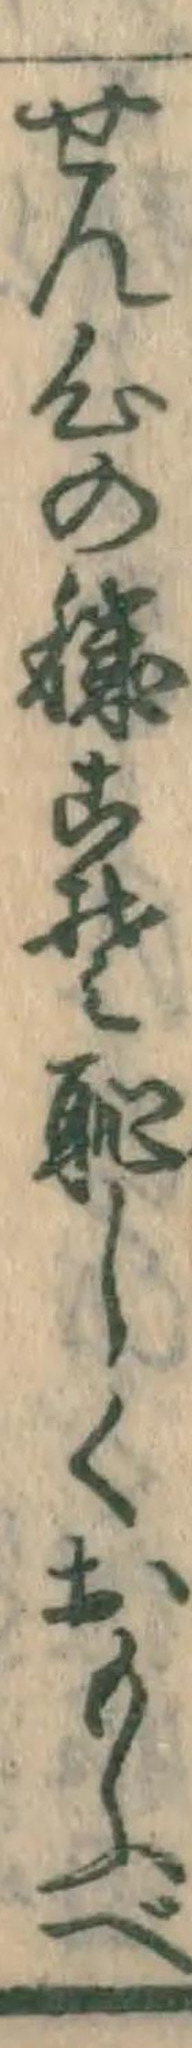せん心の穢こそ恥しくおもふべ
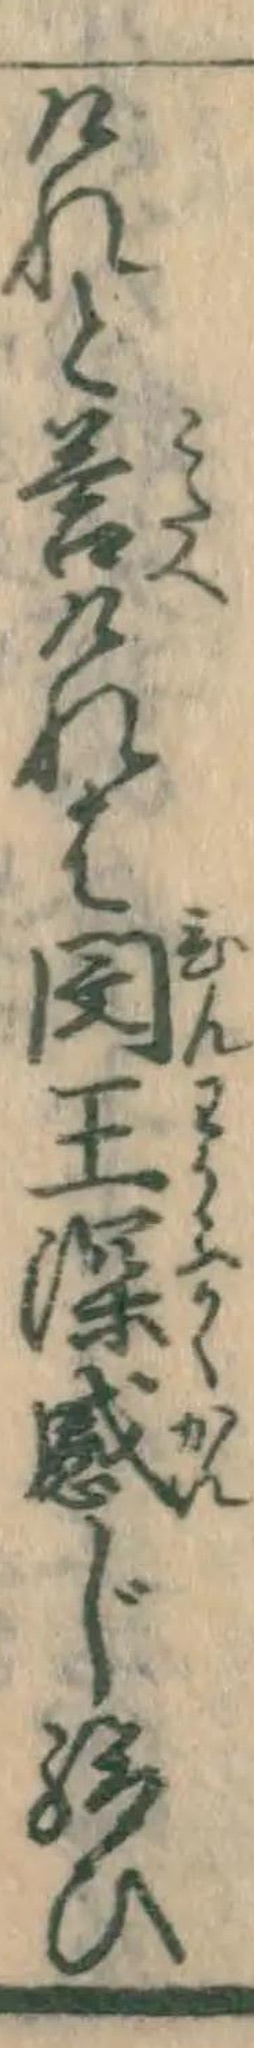けれと答けれは閔王深感じ給ひ
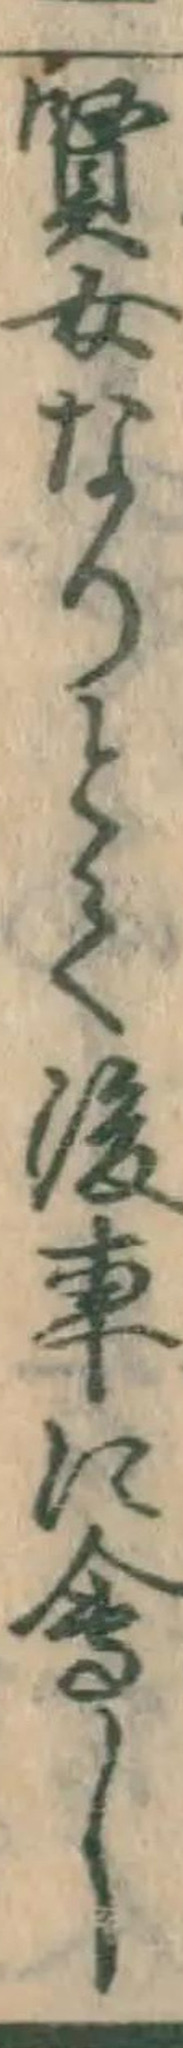賢女なりとて後車に会し
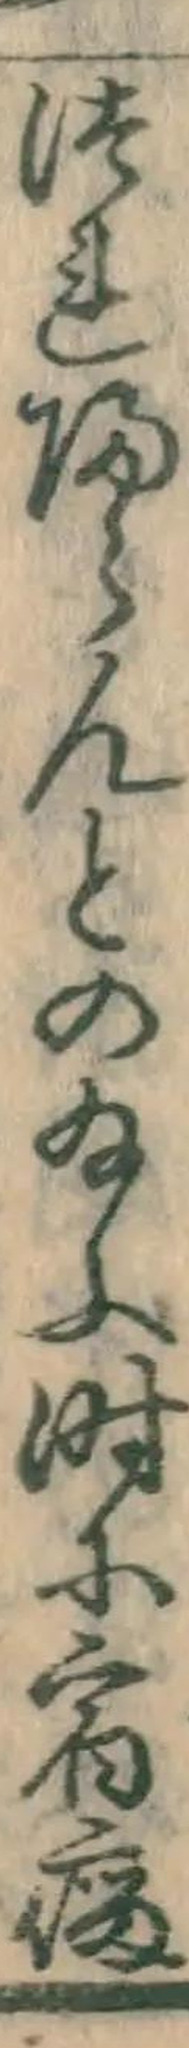つれ帰らんとの給ふ時に宿瘤
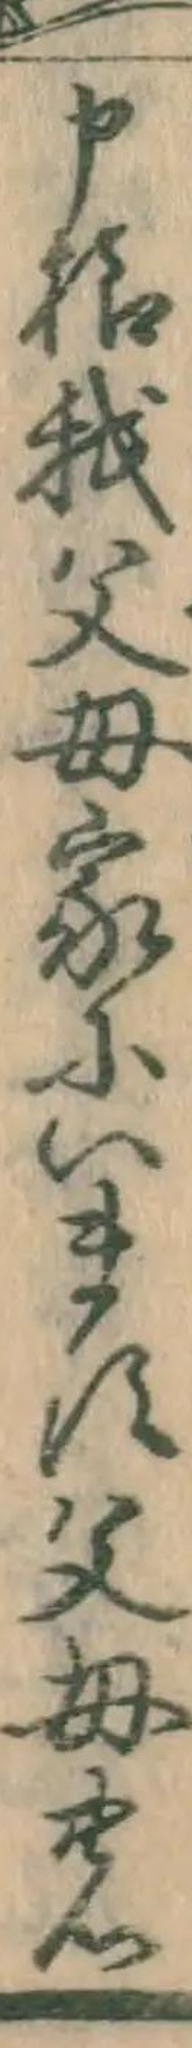申様我父母家にいます父母の
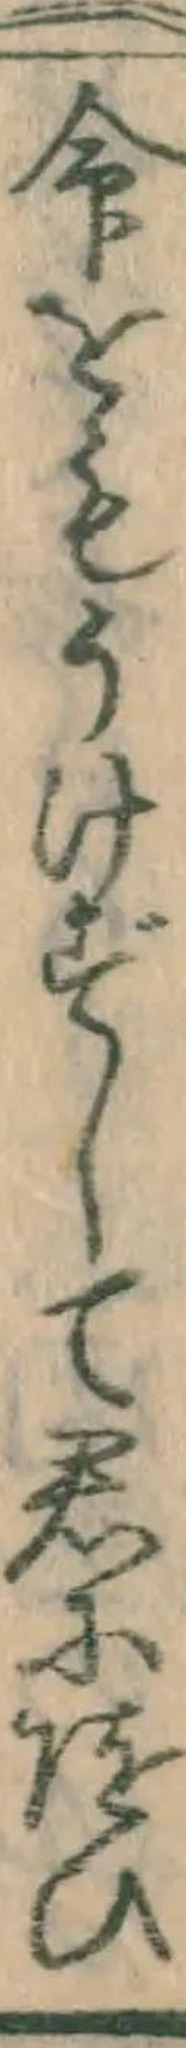命をもうけずして君に随ひ
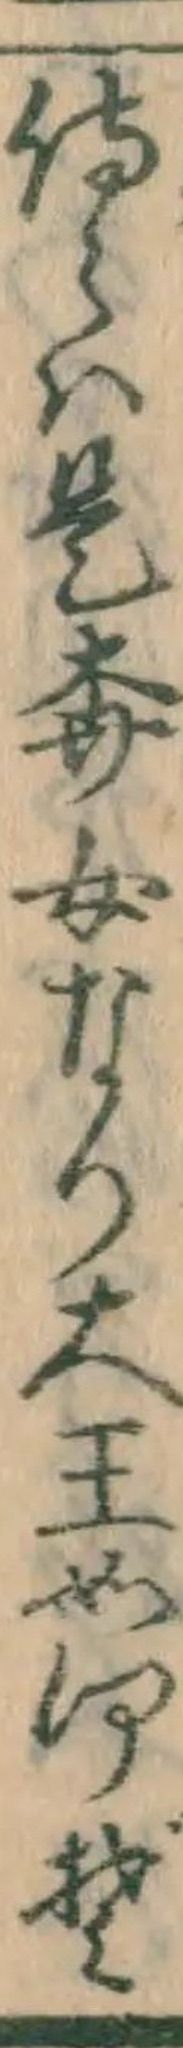侍らは是奔女なり大王如何ぞ
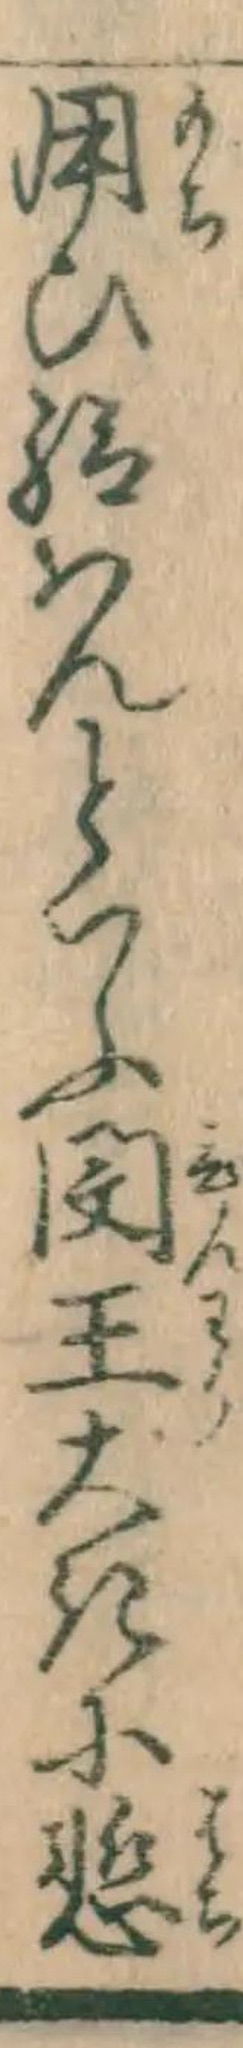用ひ給はんといふ閔王大きに慙
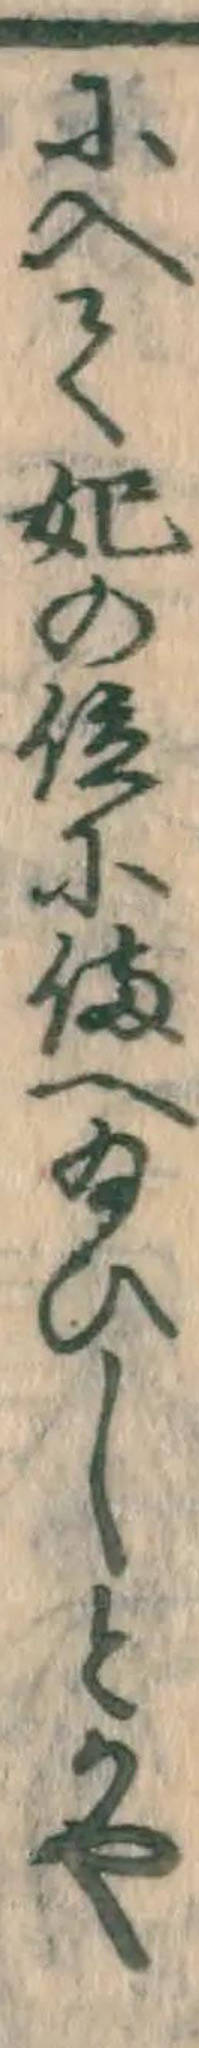に入て妃の位に備へ給ひしとかや
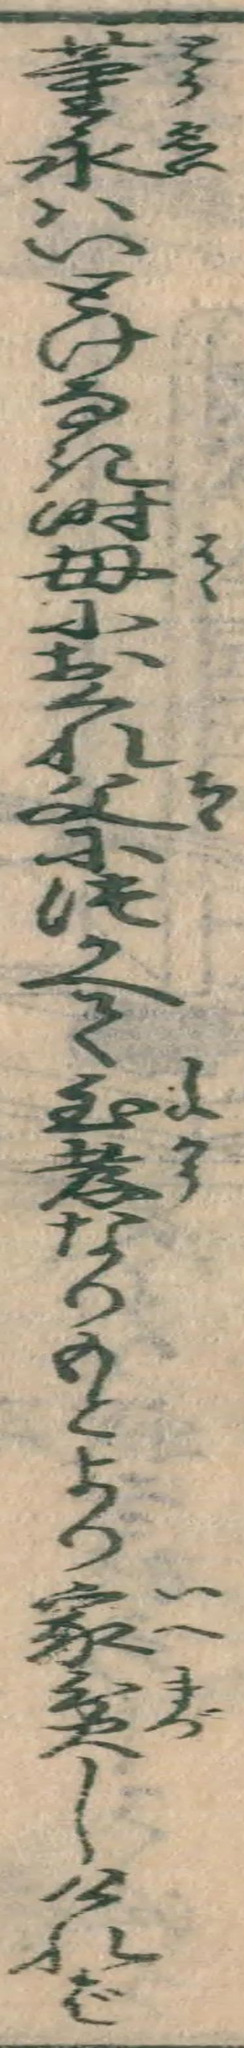董永はいとけなき時母におくれ父につかへて至孝なりもとより家貧しければ
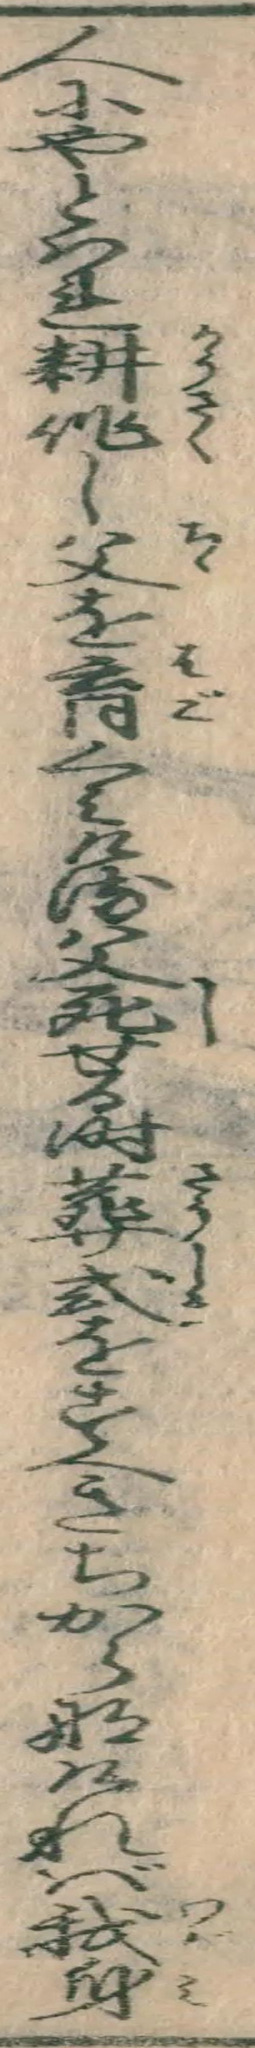人にやとはれ耕作し父を育くみける父死せる時葬式をすべきちからなければ我身
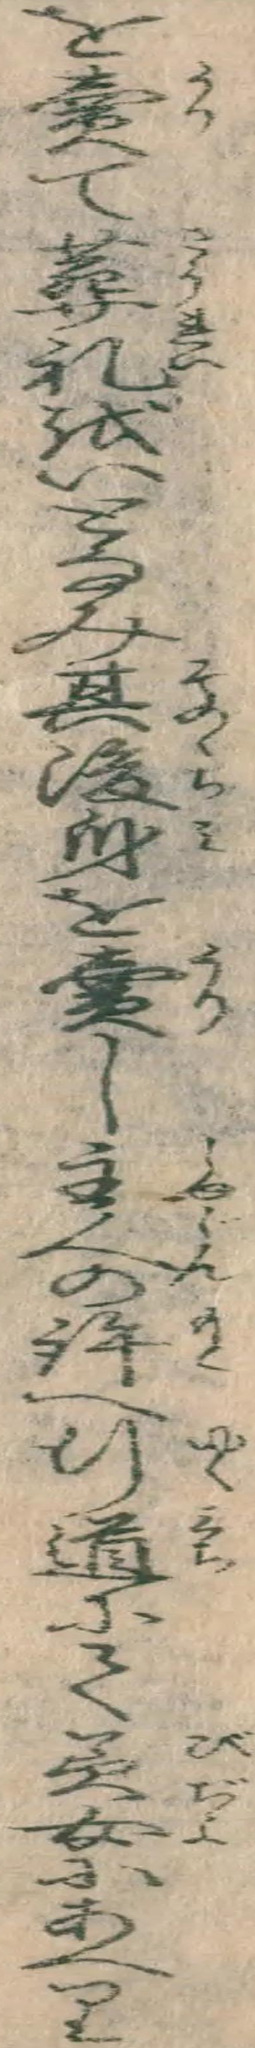を売て葬礼をいとなみ其後身を売し主人の許へ行道にて美女にあへり
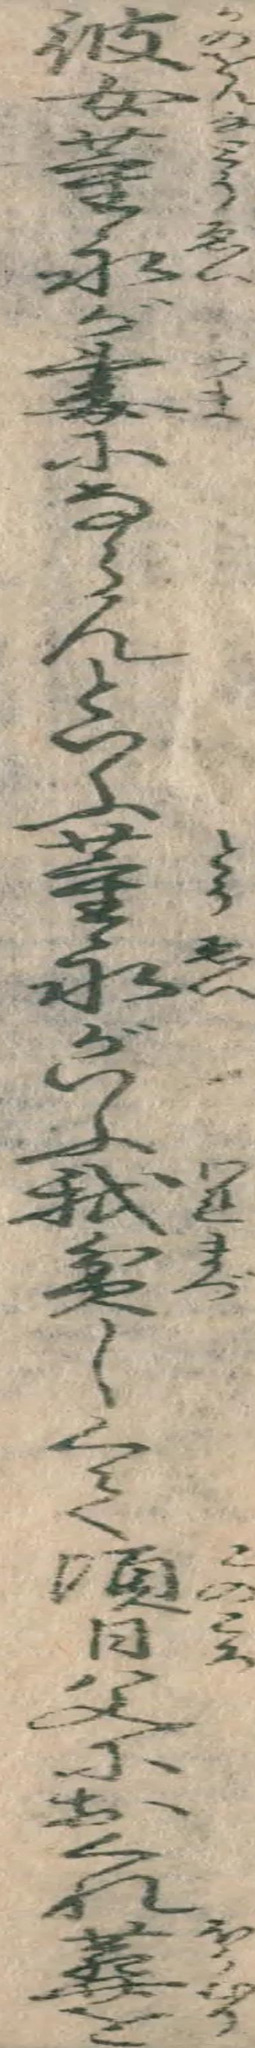彼女董永が妻にならんといふ董永がいふ我貧しくて頃日父におくれ葬を
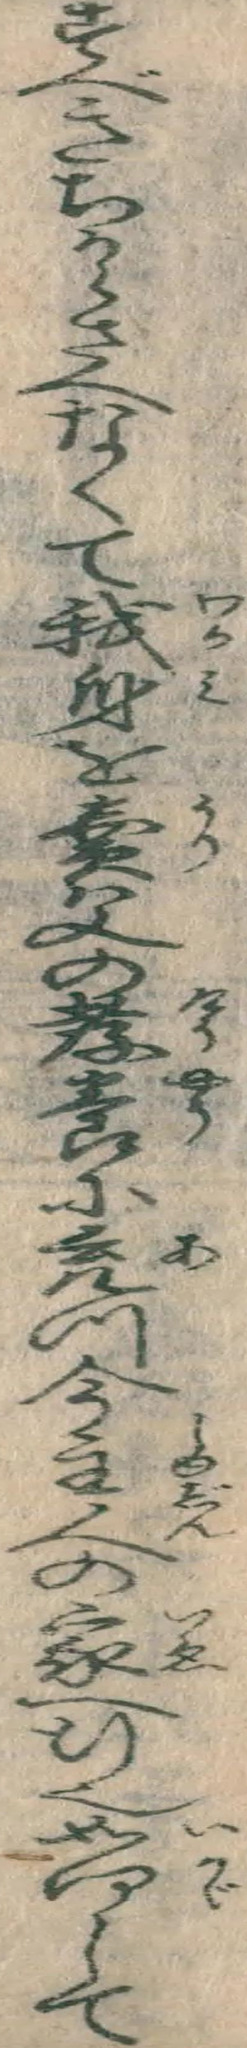すべきちからさへなくて我身を売父の孝養に充つ今主人の家へ行也如何して
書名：養蚕秘録 3巻. [3]
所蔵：国立国会図書館 National Diet Library, JAPAN
